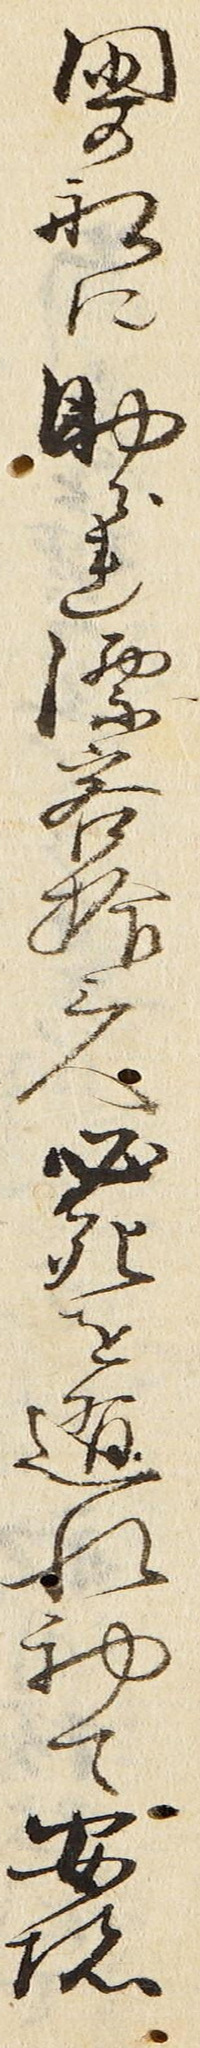国の船に助られ漂客拾三人必死を遁れ初て安堵
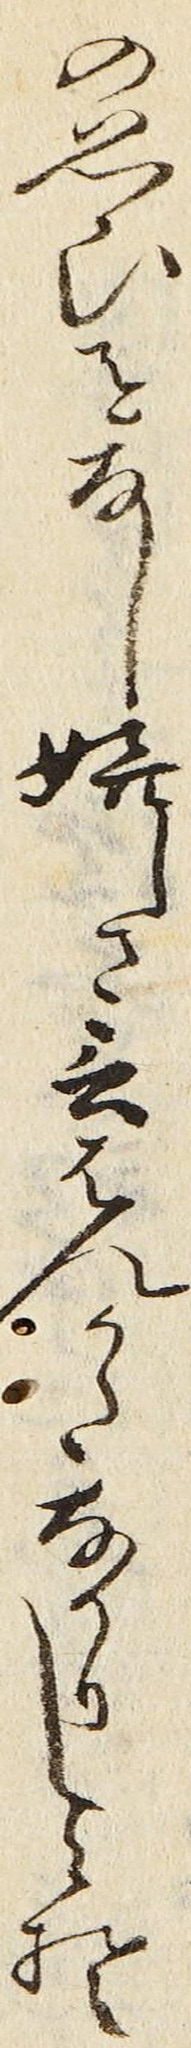の思ひをなし嬉しさ言はんかたなかりしとそ
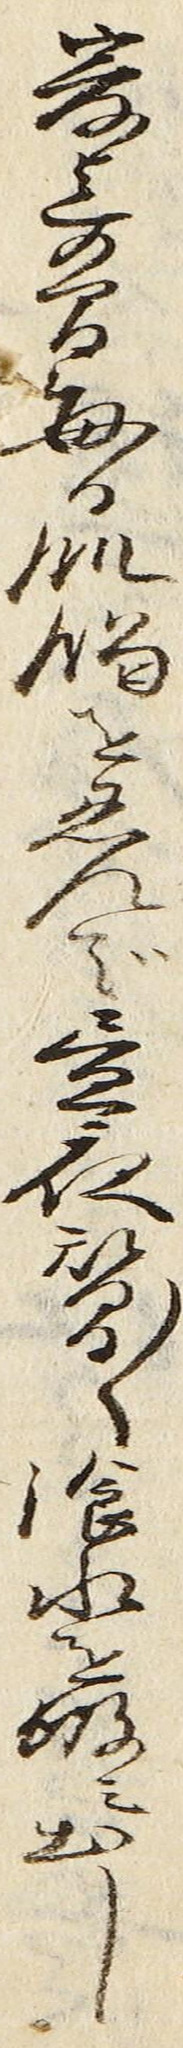爰迄の間毎日飢餲を忍んで昼夜替る〳〵浪水を汲ミ出し
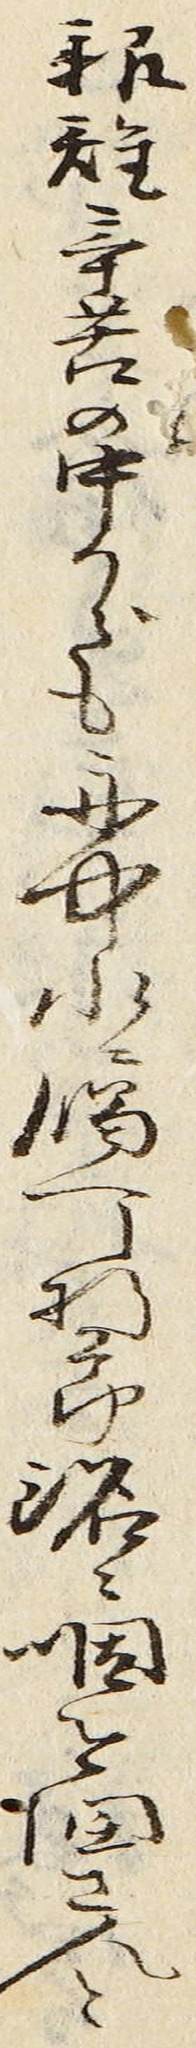艱難辛苦の中からも舟中水ニ餲へし折節銘々咽を潤さんと
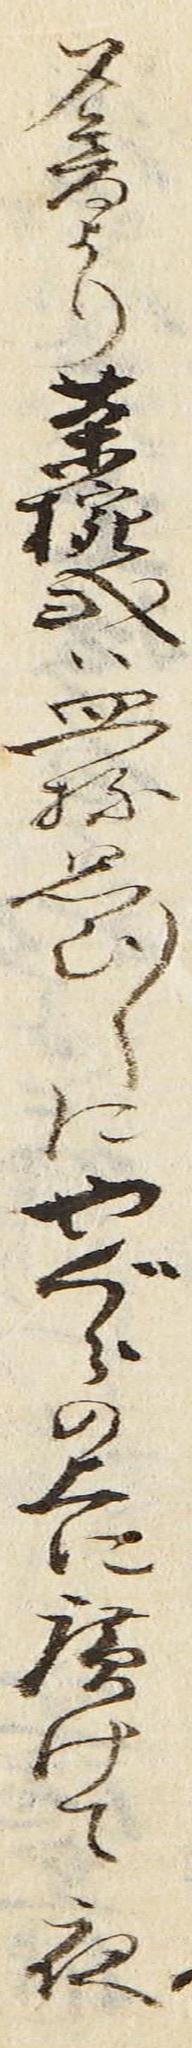夕暮より茶椀或ハ皿抔思ひ〳〵にやぐらの上に広けて夜
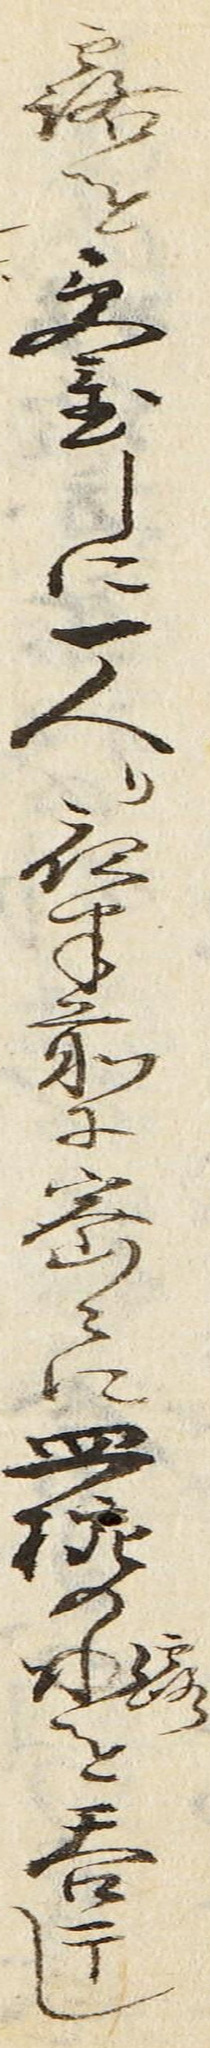露を受置しに一人り夜半前に密々に皿椀の水露を呑干し
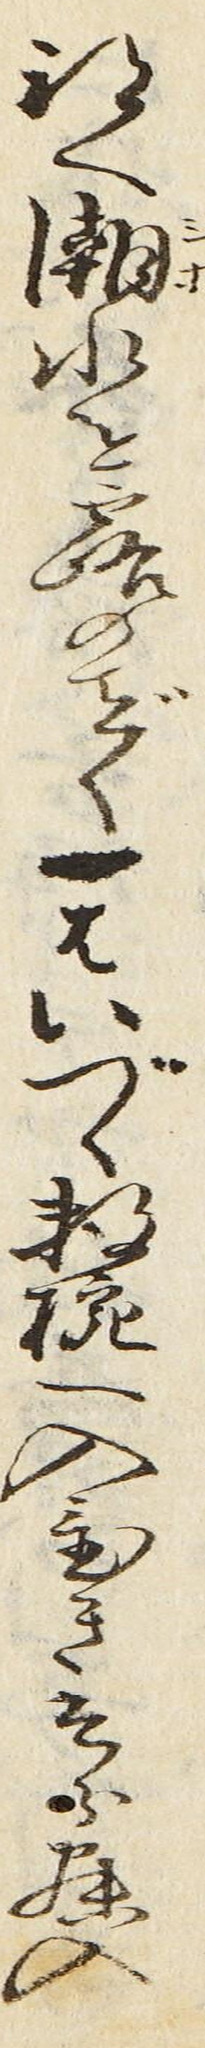跡へ潮水を露のごとく一はいづゝ数椀へ入置きそら寝入
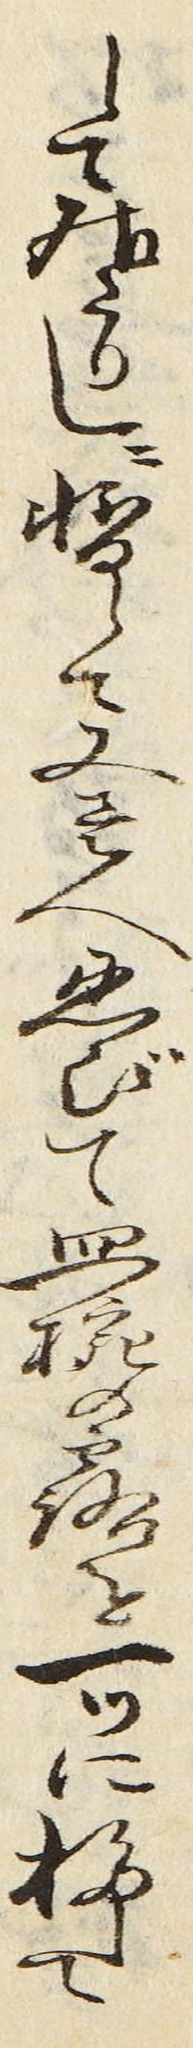して居たりしニ暫して又壱人忍びて皿椀の露を一ツに移して
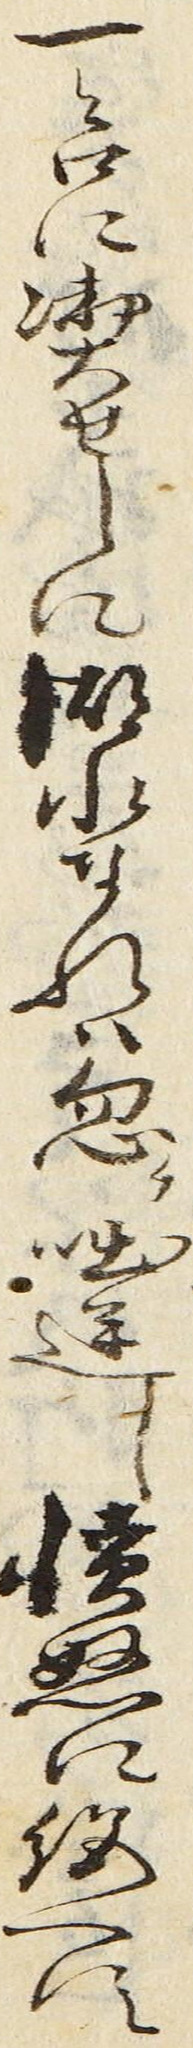一と口にせしに潮水なれハ忽チ吐送し憤怒に絶へす
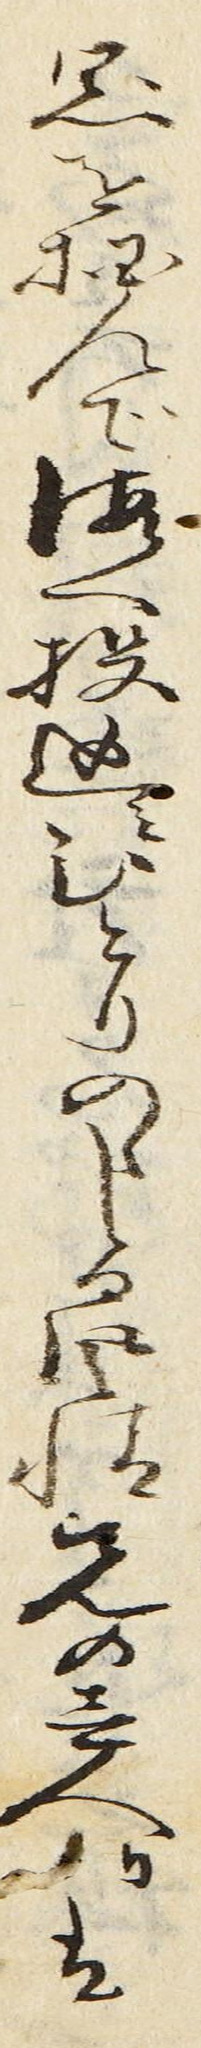器を掴んで海へ投込ミひとりのゝしる風情先の壱人りは
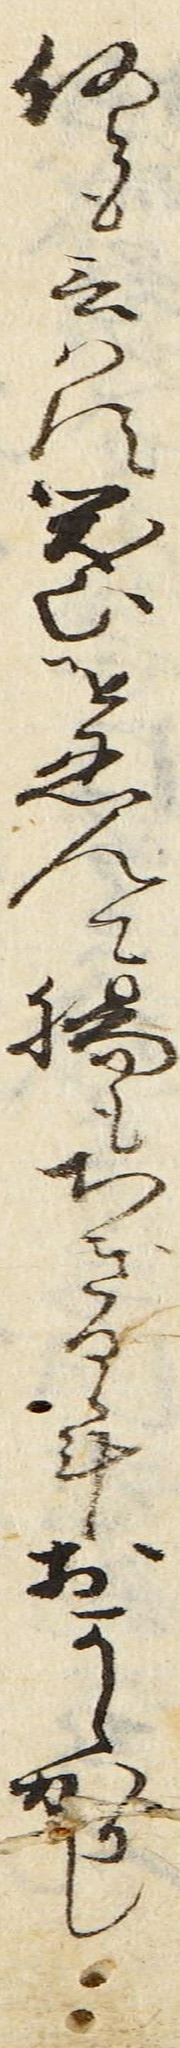何とも言ハす笑ひを忍んて腸もちぎるゝ計おかしかりし
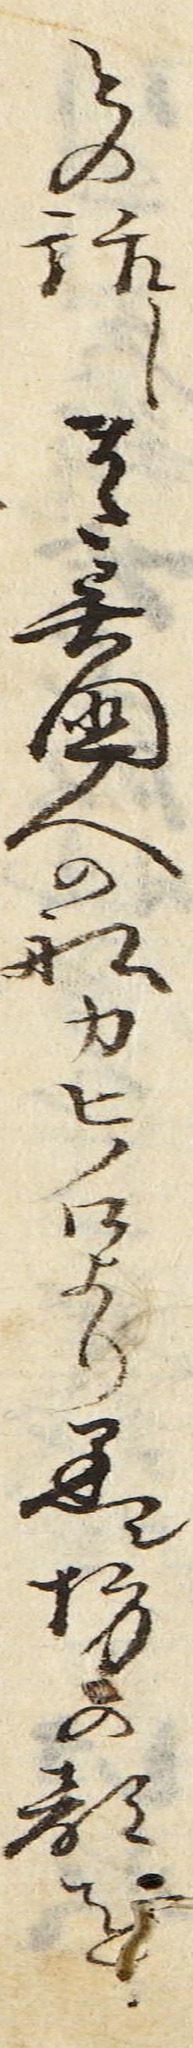との話しまた異国人の船カヒノ口より黒ン坊の顔を
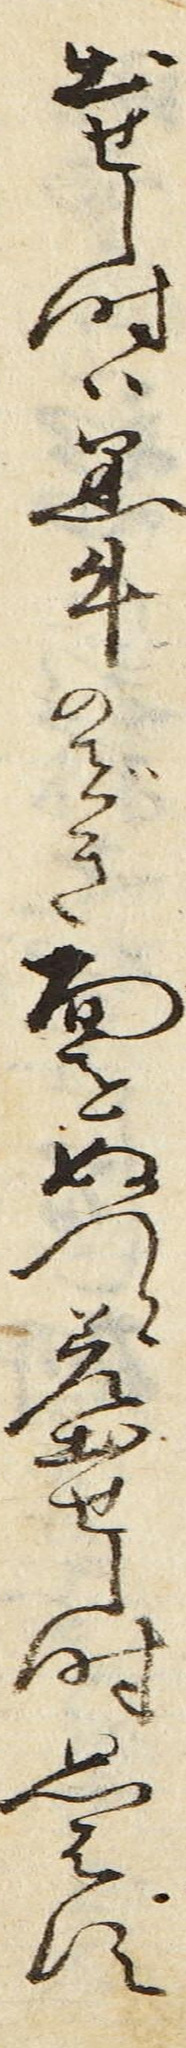出せし時ハ黒牛のごとき面をぬつと差出せし時思はす
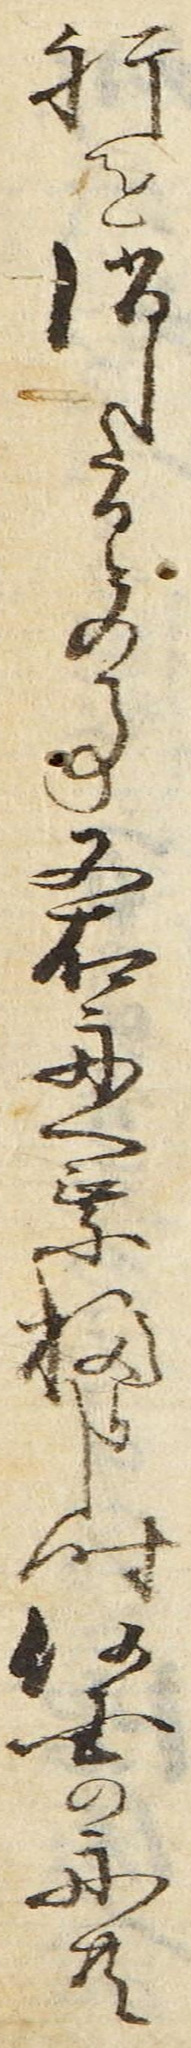肝を消したるとの事又右舟へ乗移りし時何国の舟共

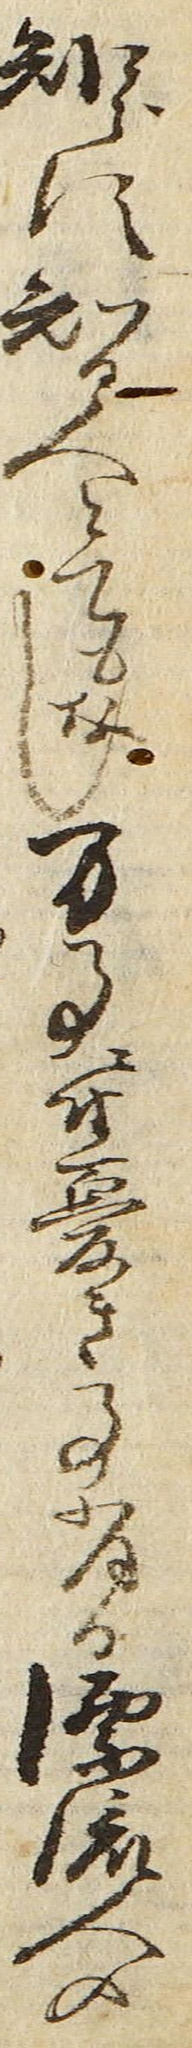知らす知る人とてもなし万事ニ付憂き事有る漂流人の
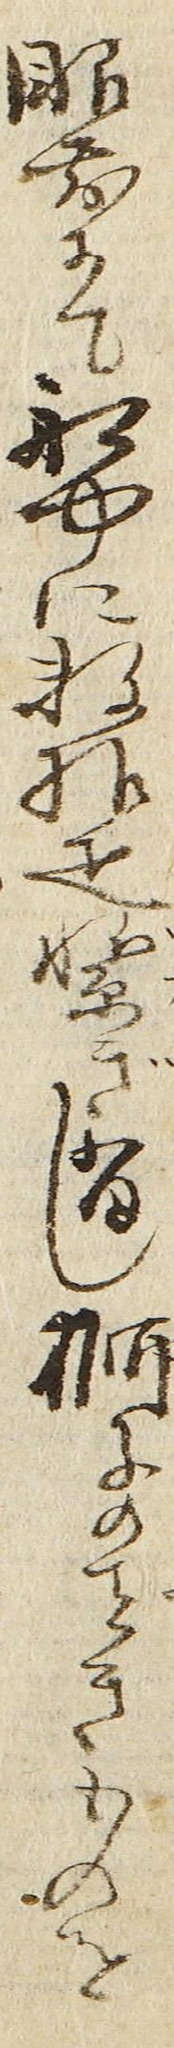眼前にて船中に数拾疋繋ぎ有し獅子のごときものを
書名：亜墨利加漂流記聞
